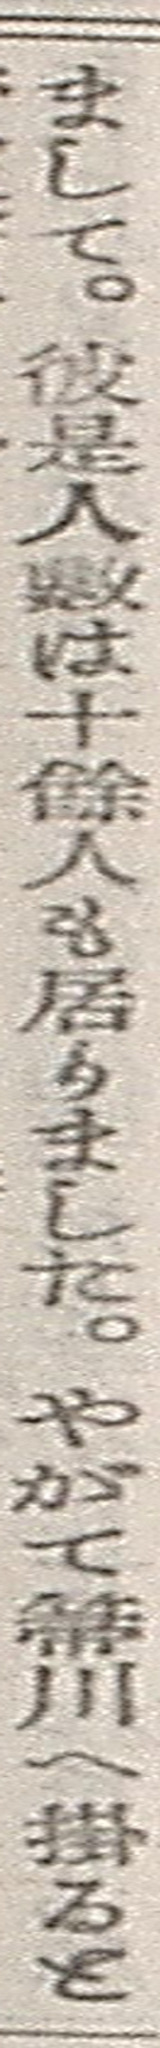まして。彼是人数は十余人も居りました。やがて箒川へ掛ると
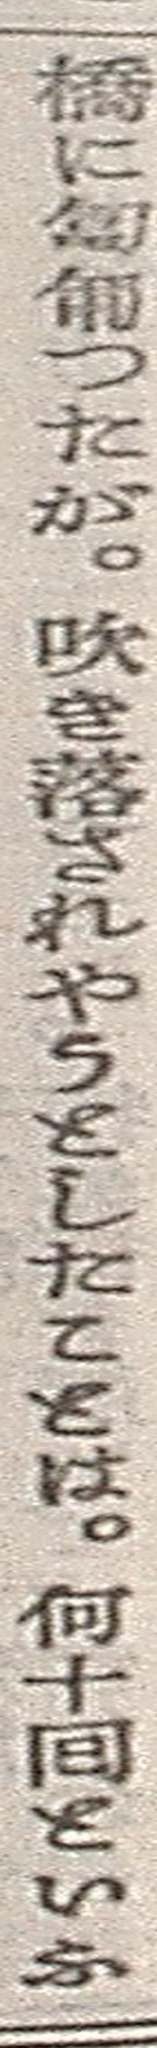橋に匐匍つたが。吹き落されやうとしたことは。何十回といふ
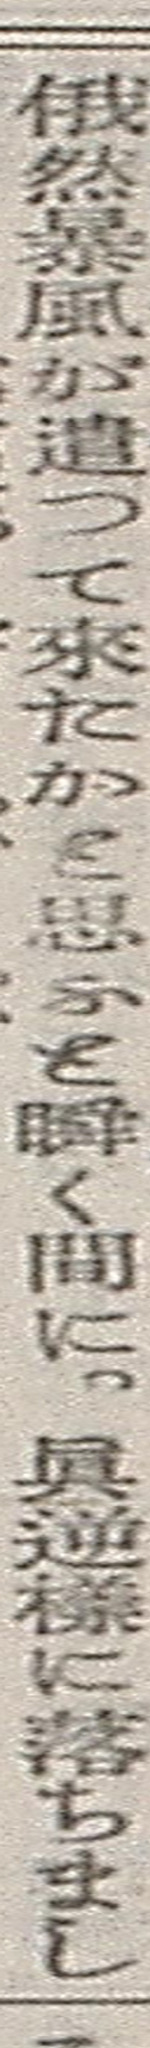俄然暴風が遣つて来たかと思ふと瞬く間に。真逆様に落ちまし
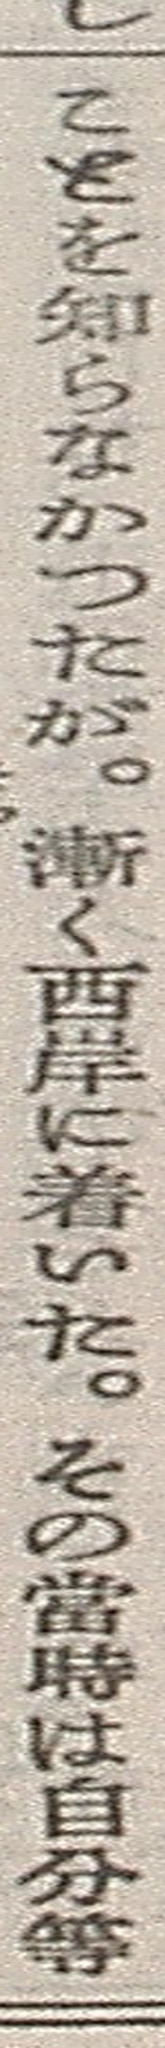ことを知らなかつたが。漸く西岸に着いた。その当時は自分等
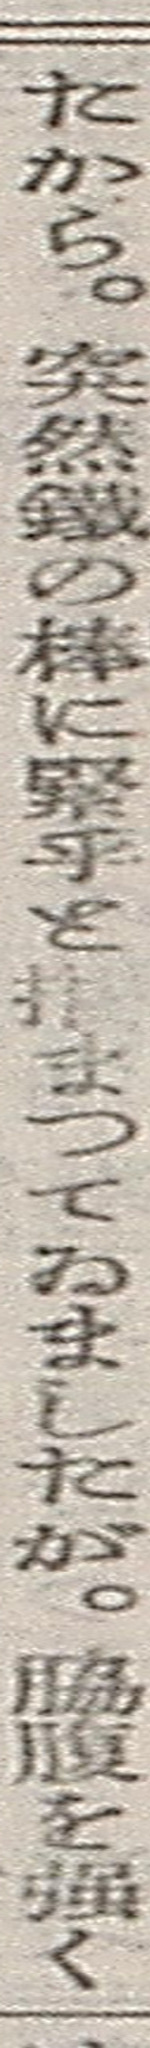たから。突然鉄の棒に緊乎と掴まつてゐましたが。脇腹を強く
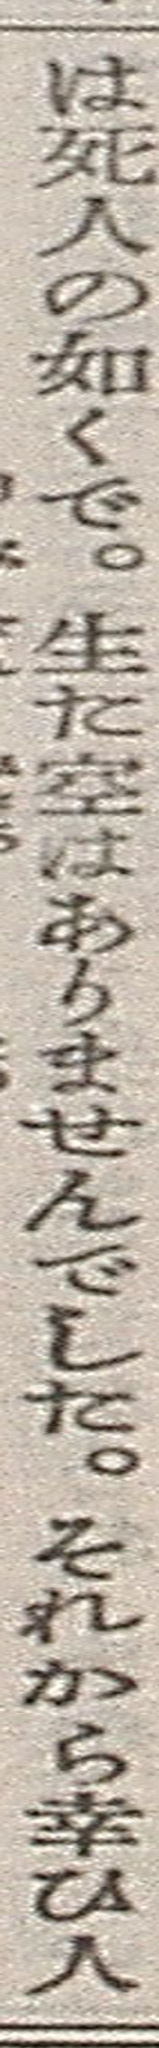は死人の如くで。生た空はありませんでした。それから幸ひ人
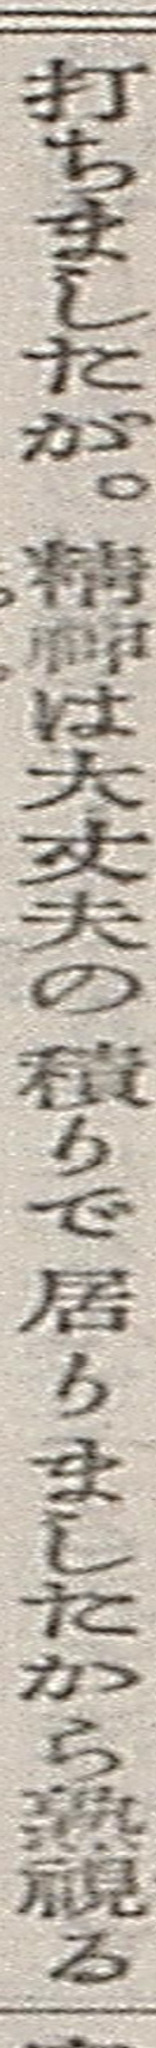打ちましたが。精神は大丈夫の積りで居りましたから熟視る
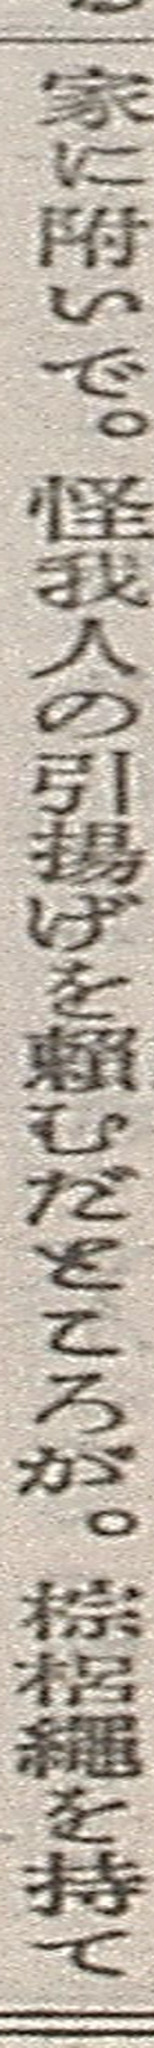家に附いで。怪我人の引揚げを頼むだところが。棕梠縄を持て
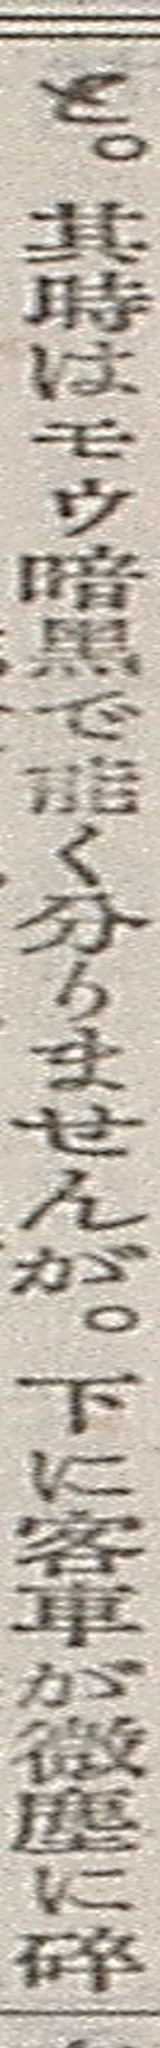と。其時はモウ暗黒で能く分りませんが。下に客車が微塵に砕
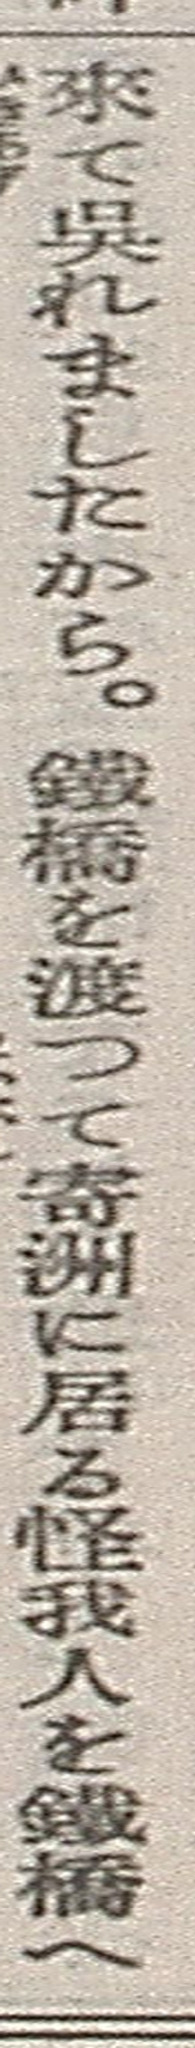来て呉れましたから。鉄橋を渡つて寄洲に居る怪我人を鉄橋へ
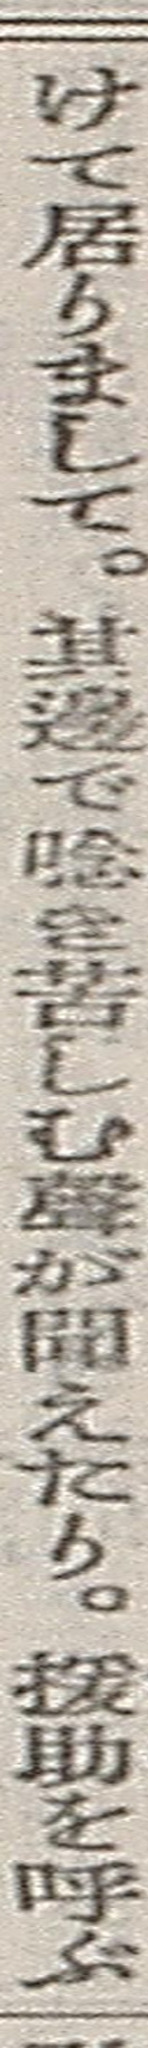けて居りまして。其辺で唸き苦しむ声が聞えたり。援助を呼ぶ
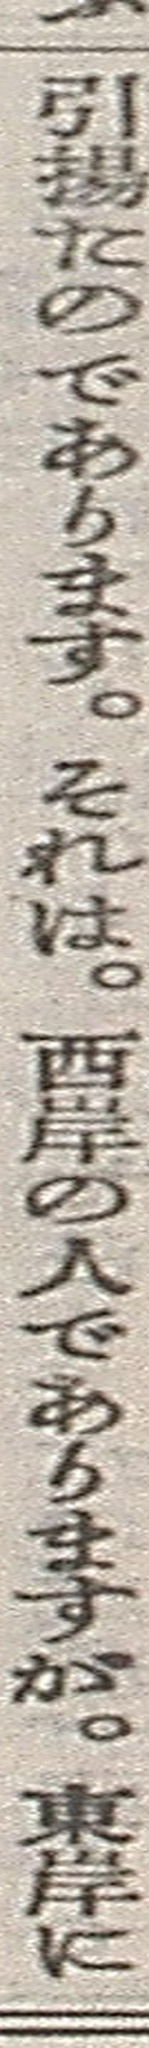引揚たのであります。それは。西岸の人でありますが。東岸に
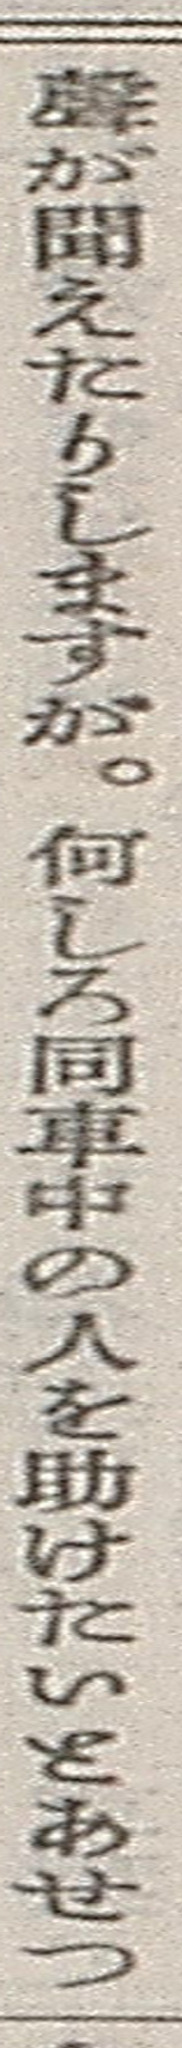声が聞えたりしますが。何しろ同車中の人を助けたいとあせつ
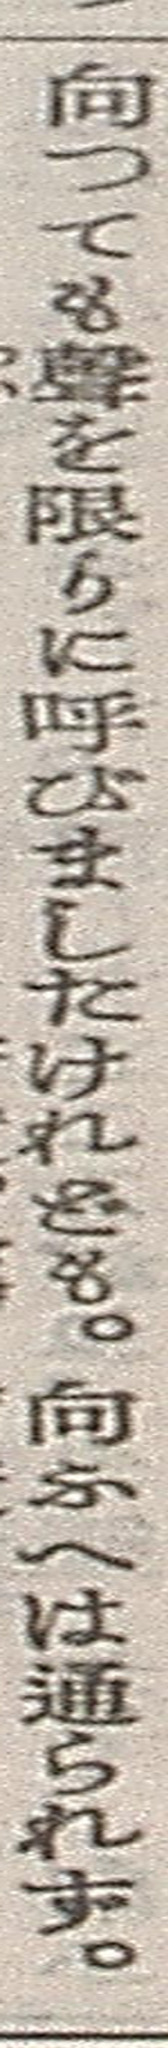向つても声を限りに呼びましたけれども。向ふへは通られず。
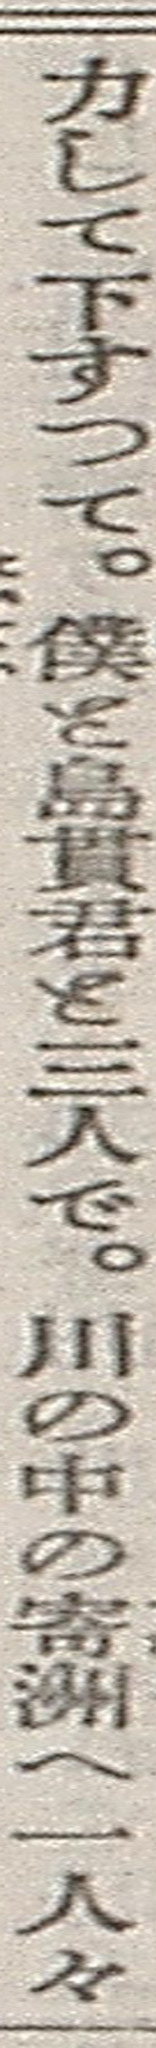力して下すつて。僕と島貫君と三人で。川の中の寄洲へ一人々
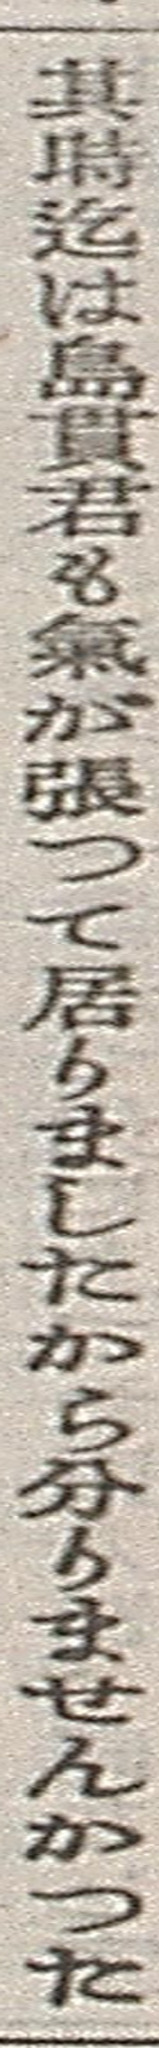其時迄は島貫君も気が張つて居りましたから分りませんかつた
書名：風俗畫報臨時増刊第百九十九號　明治三十二年十月各地災害圖會（前編之續）
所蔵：東京大学地震研究所図書室 Earthquake Research Institute Library, The University of Tokyo, JAPAN
